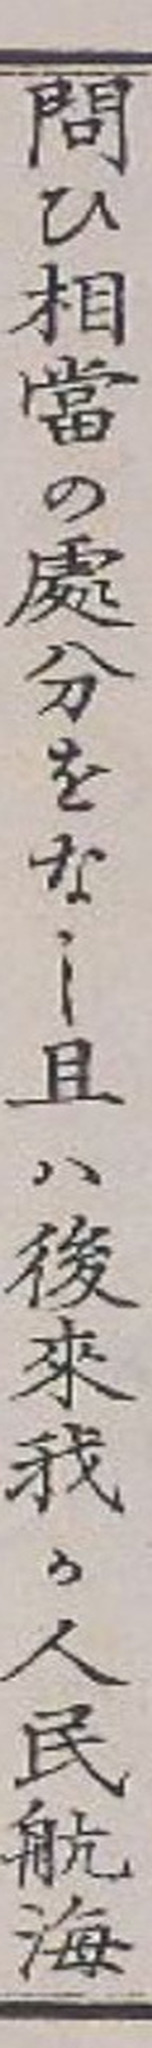問ひ相当の処分をなし且は後来我か人民航海
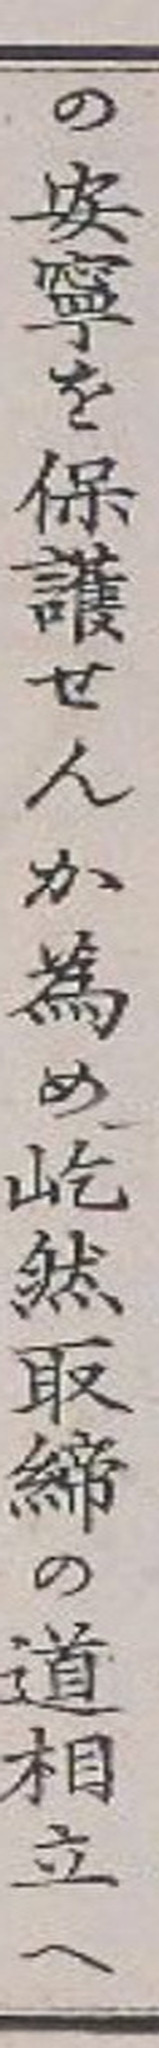の安寧を保護せんか為め屹然取締の道相立へ
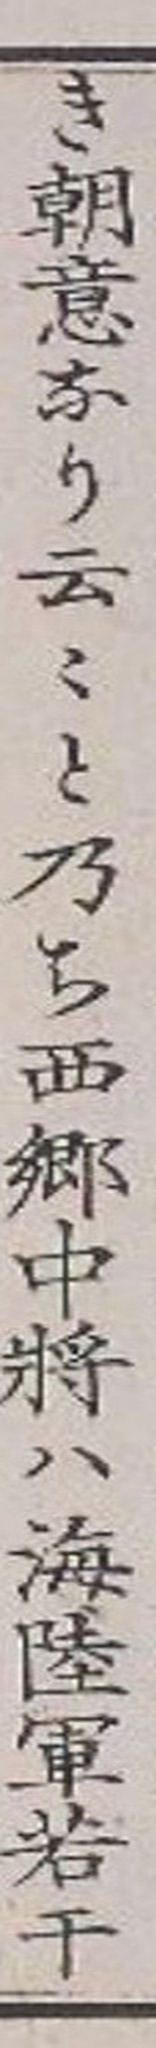き朝意なり云々と乃ち西郷中将はう陸軍若干
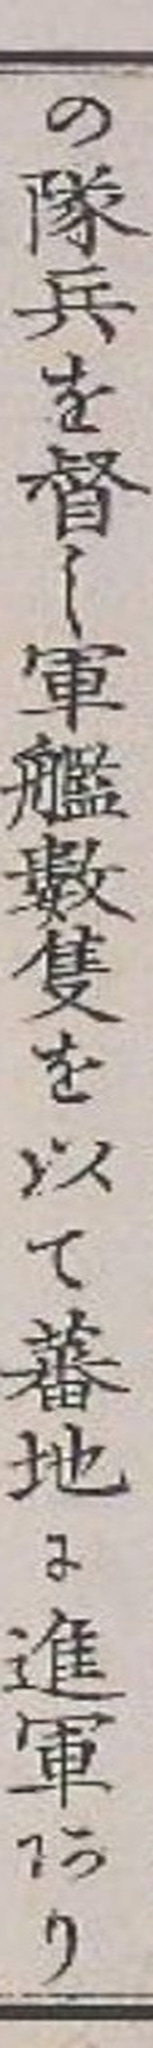の隊兵を督し軍艦数隻を以て蕃地に進軍あり
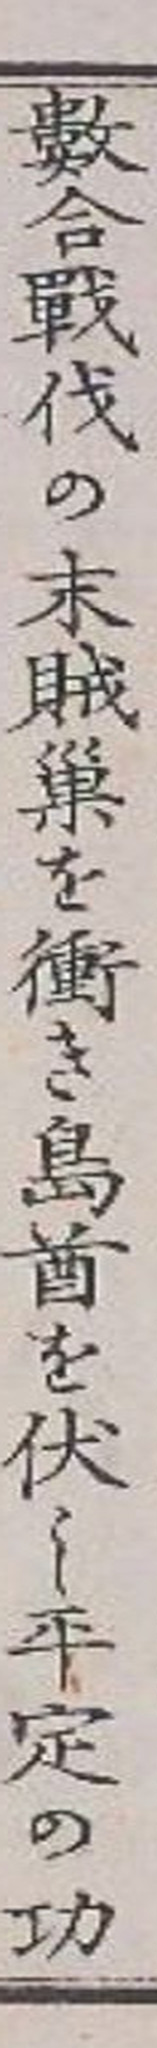数合戦伐の末賊巣を衝き島首を伏し平定の功
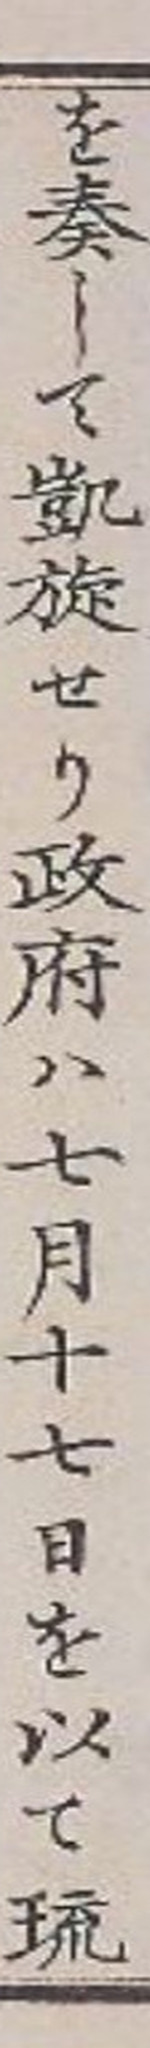を奏して凱旋せり政府は七月十七日を以て琉
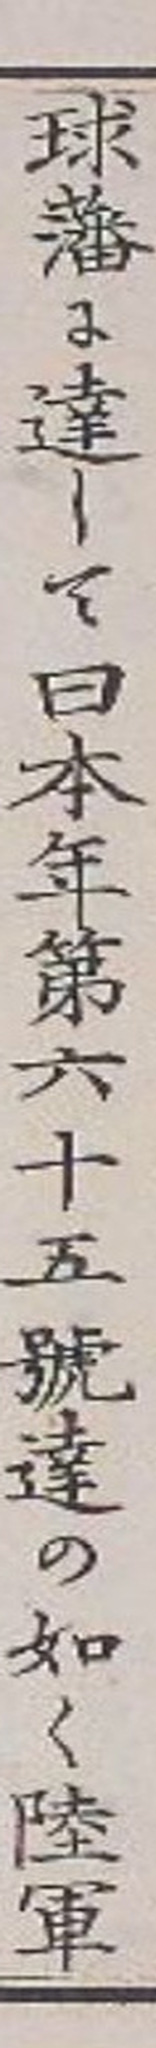球藩に達して曰本年第六十五号達の如く陸軍
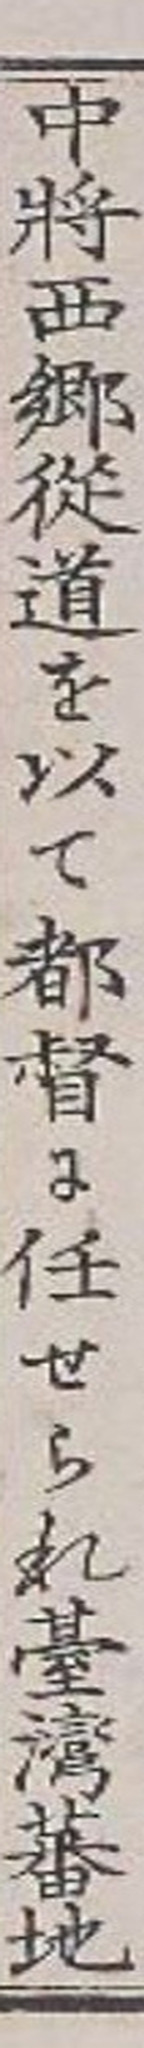中将西郷従道を以て都督に任せられ台湾蕃地
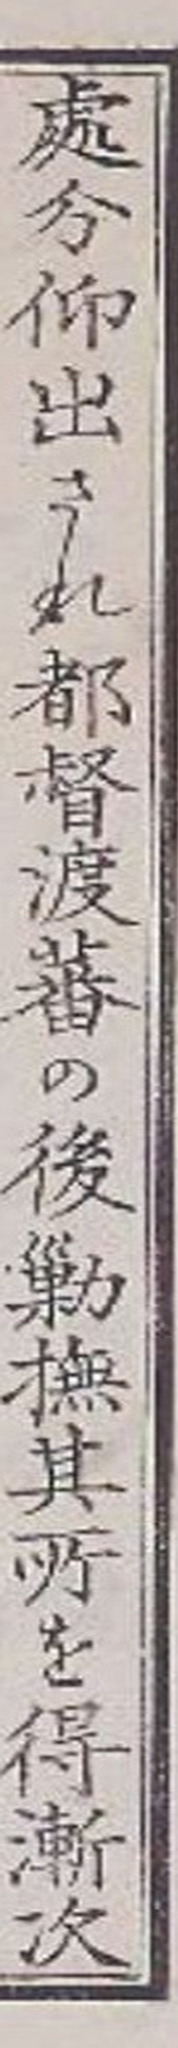処分仰出され都督渡蕃の後勦撫其所を得漸次
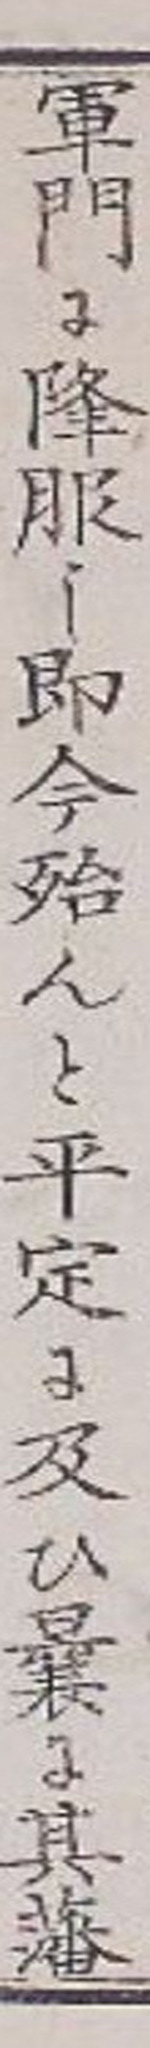軍門に降伏し即今殆んと平定に及ひ曩に其蕃
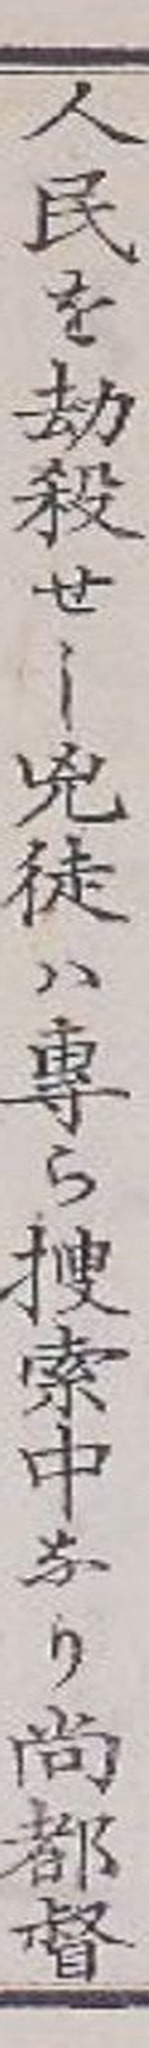人民を劫殺せし兇徒は専ら捜索中なり尚都督
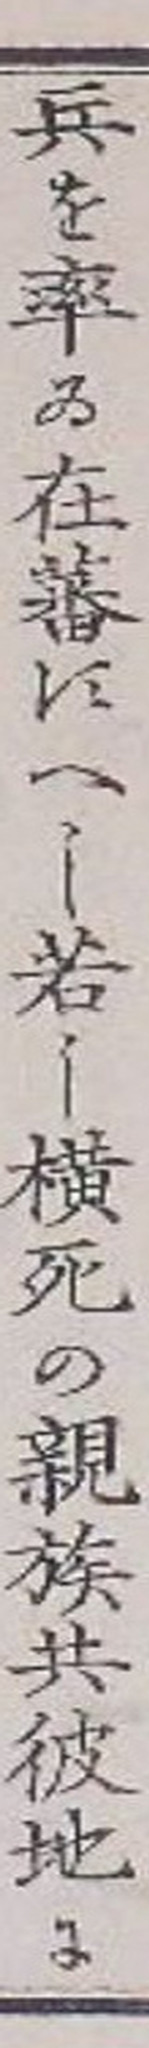兵を率ゐ在蕃すへし若し横死の親族共彼地に
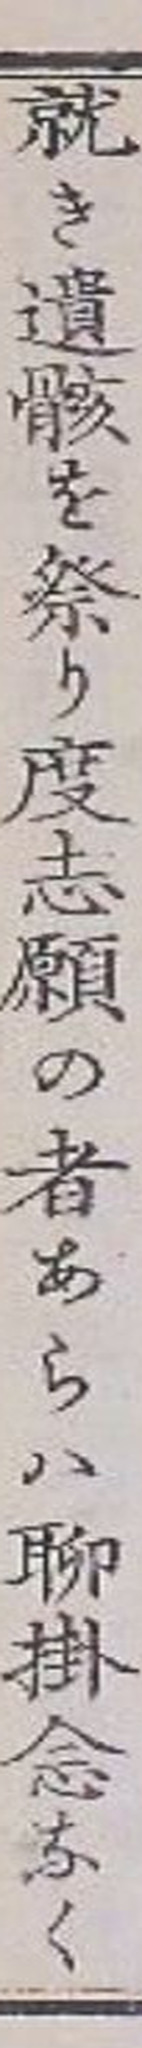就き遺骸を祭り度志願の者あらは聚掛念なく
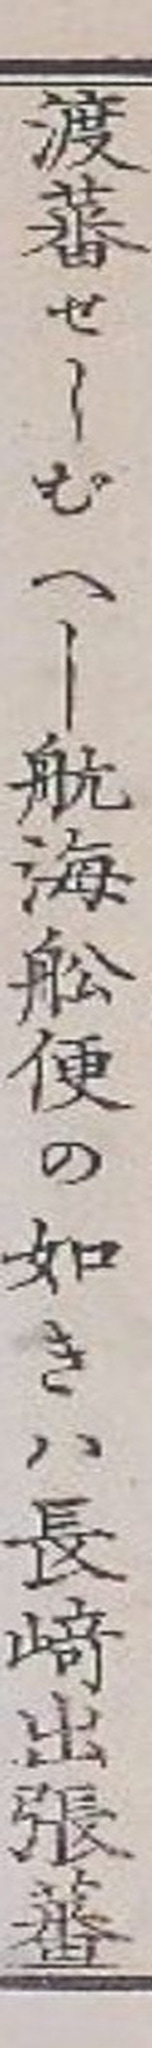渡蕃せしむへし航海船便の如きは長崎出張蕃
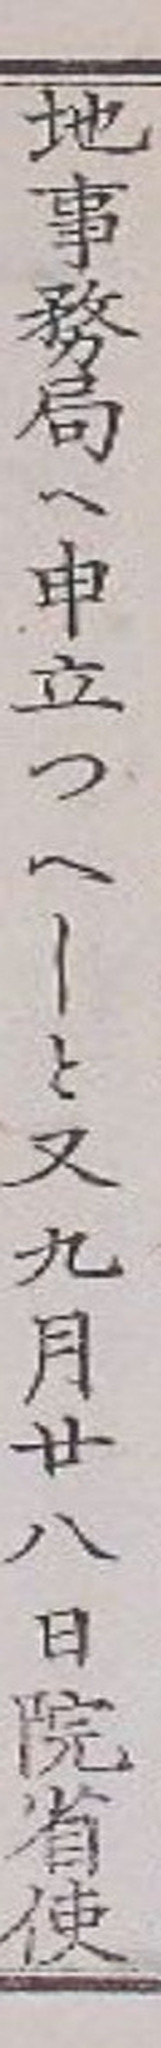地事務局へ申立つへしと又九月廿八日院省使
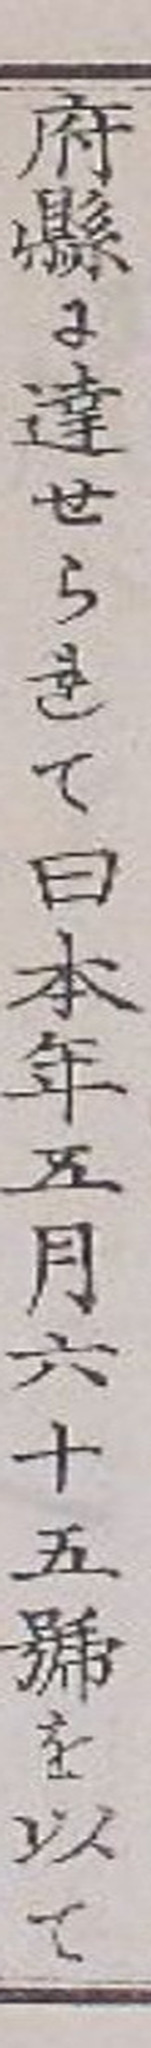府県に達せられて曰本年五月六十五号を以て
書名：南島紀事 下
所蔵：University of the Ryukyus Library
